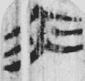亦
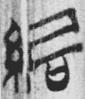紀
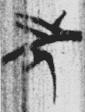先
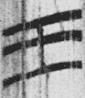王
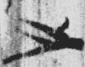之
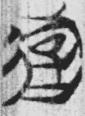遊
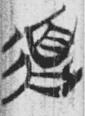道
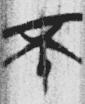不
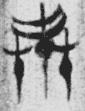奉
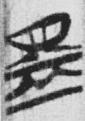○（盟）
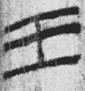王
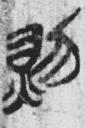則（則）
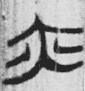亦
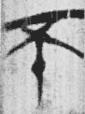不
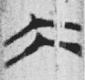大
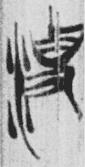淒
